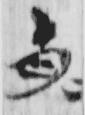十月
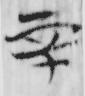辛
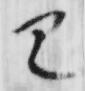巳
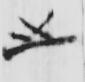之
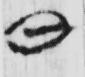日
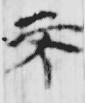不
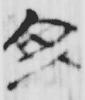安
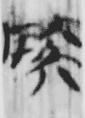陸
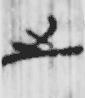之
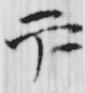下
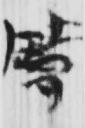○（隋）
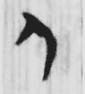人
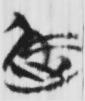○（屈）
